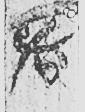左
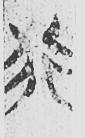行
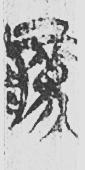{疒蔑}
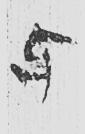与
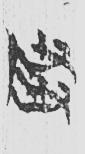{阜圭㕛}
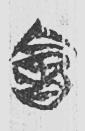會
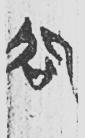卲
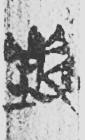襄
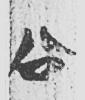公
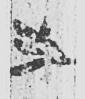之
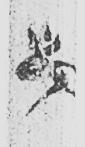弟
